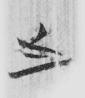之
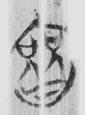噞
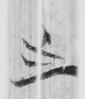之
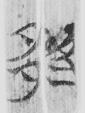{多欠}
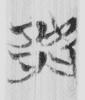{多欠}
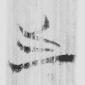之
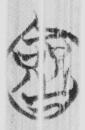噞
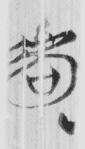唬
